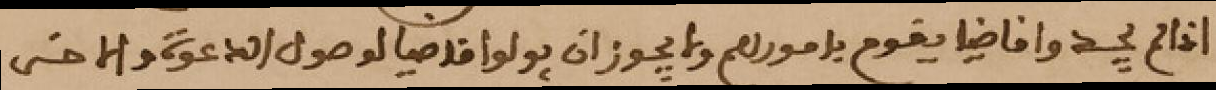اذا لم يجدوا قاضيا يقوم بامورهم ولا يجوز ان يولوا قاضيا لوصول الدعوة والا حتى
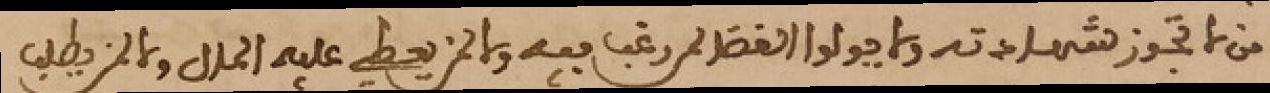من لا تجوز شهادته ولا يولوا القضا من رغب فيه ولا من يعطي عليه المال ولا من يطلب
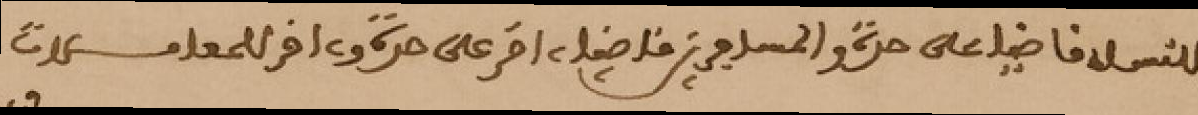للنساء قاضيا على حدة والمسافر قاضيا ءاخر على حدة وءاخر للمعاملات وءاخر
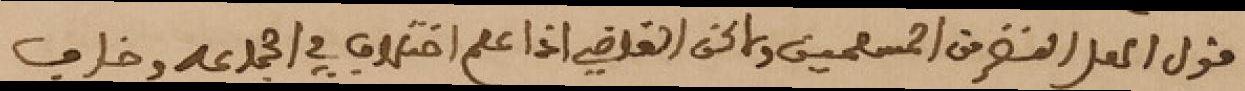قول اهل النظر من المسلمين ولا الحق القاضي اذا علم اختلاف في الجماعة وخاف
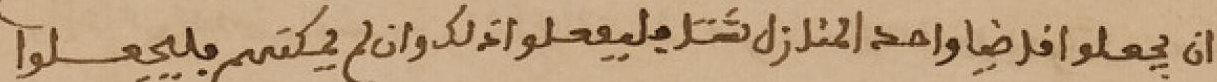ان يجعلوا قاضيا واحدالمنازل شتى فليفعلوا ذلك وان لم يمكنهم فليجعلوا
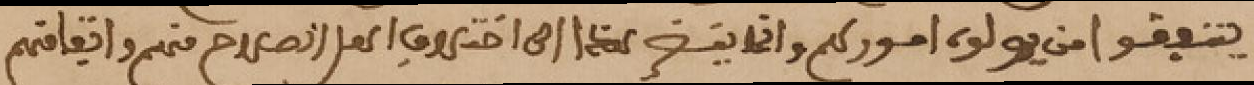يتفقوا من يولوه امورهم و#ينصرهذا الاختلاف المل الصلاح منهم واتفاقهم
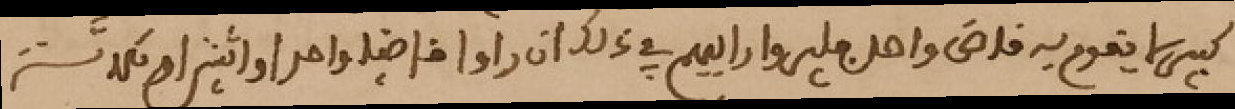كبير لا يقوم به قاض واحدفليروا رايهم في ذلك ان راوا قاضيا واحد او اثنين او ثلاثة
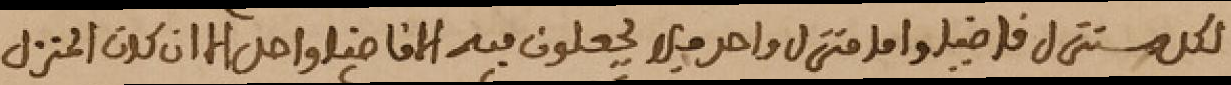لكل منزل قاضيا واما منزل واحد فلا يجعلون فيه الا قاضيا واحد الا ان كان المنزل
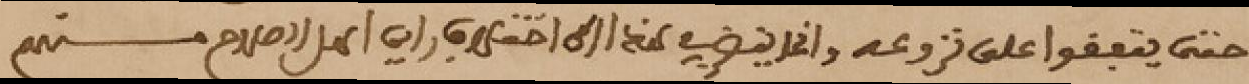حتى يتفقوا على نزوعه وانما ينبغي في هذا الاختلاف راي اهل الصلاح منهم
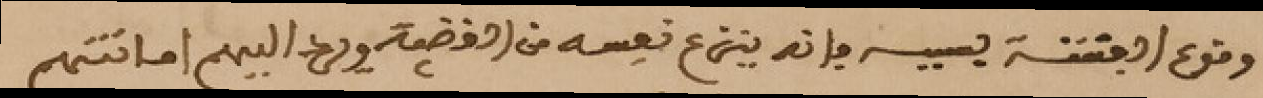وقوع الفتنة بسببه فانه ينزع نفسه من القضية ويرد اليهم امانتهم
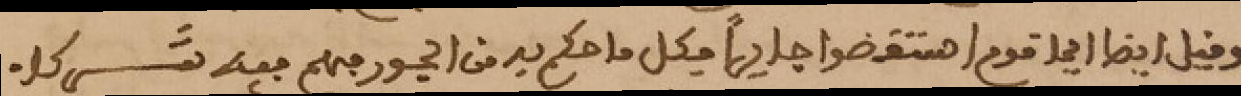وقيل ايضا ايما قوم استقضوا جايرا يكل ما حكم به من الجور منهم
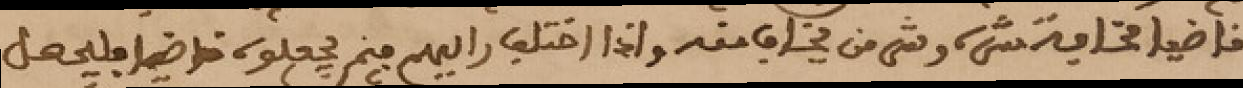قاضيا مخافة شره وشر من يخاف حقه واذا اختلف رايهم فيمن يجعلوه قاضيا فليحصل
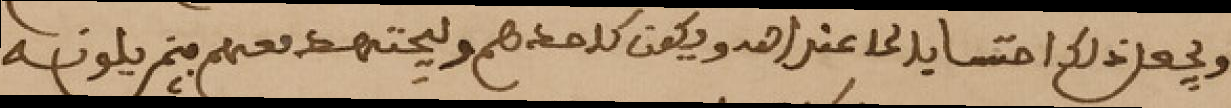ويجعل ذلك احتسابا لما عند الله ويكون كاحدهم وليجتهد معهم فيمن يلونه
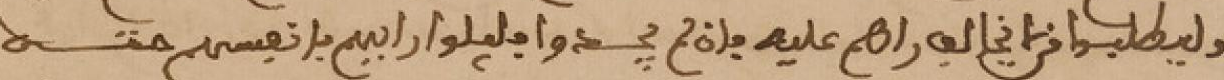وليطلبوا من لا يخالف راهم عليه فان لم يجدوا فليولوا رايهم بانفسهم حتى
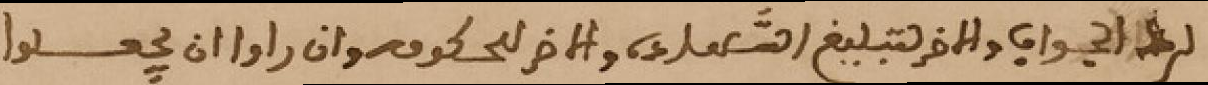لرد الجواب والاخر لتبليغ الشهادة والاخر لحكومه وان راوا ان يجعلوا
